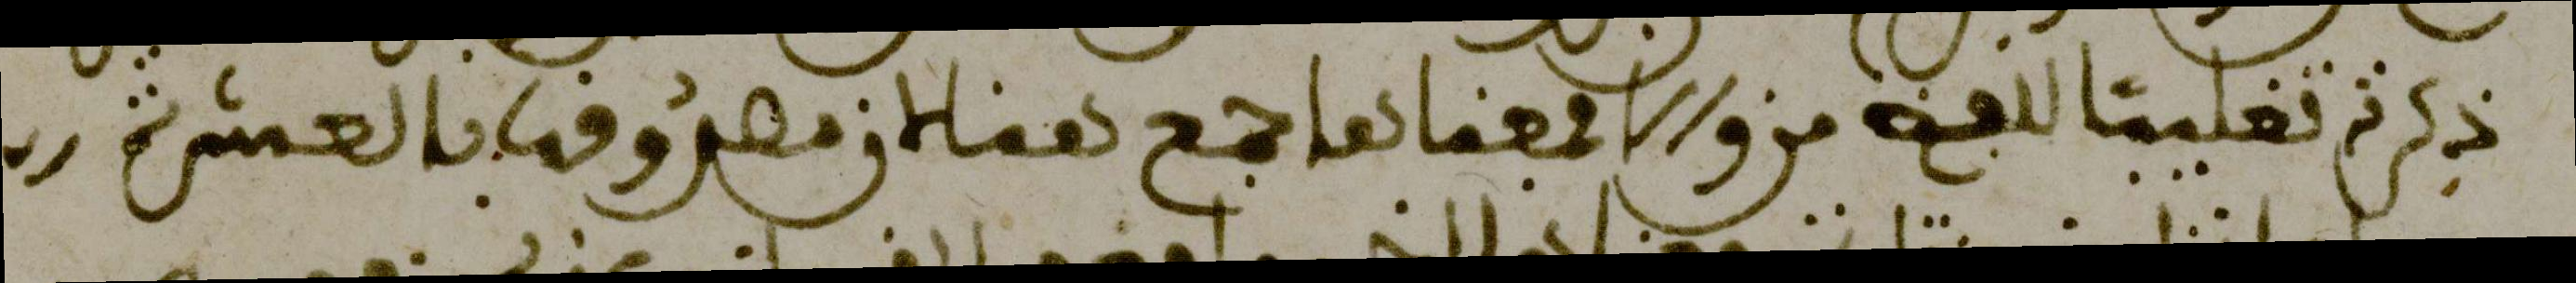ذكرته تغليبًا للفض من والا فمعناها جمع هنا لان مصدوقها بالعشرة
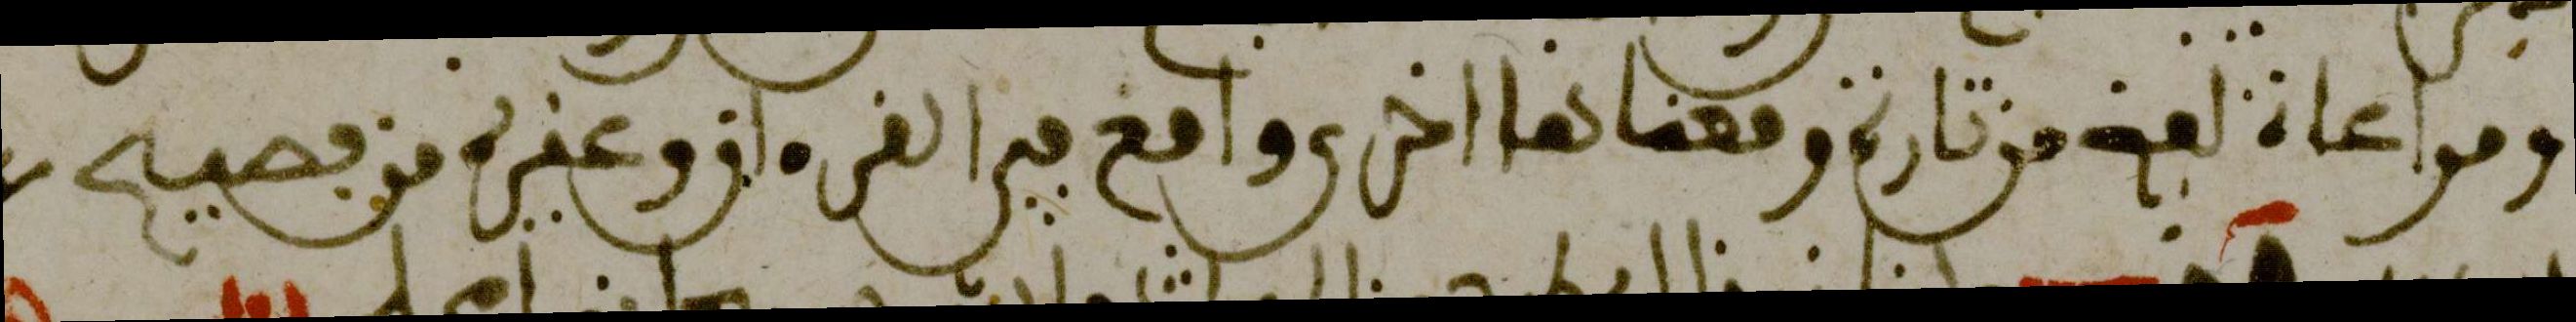ومراهاة لفض من تارة ومعناها اخرى واقع في القرءان وغيره من فصيح
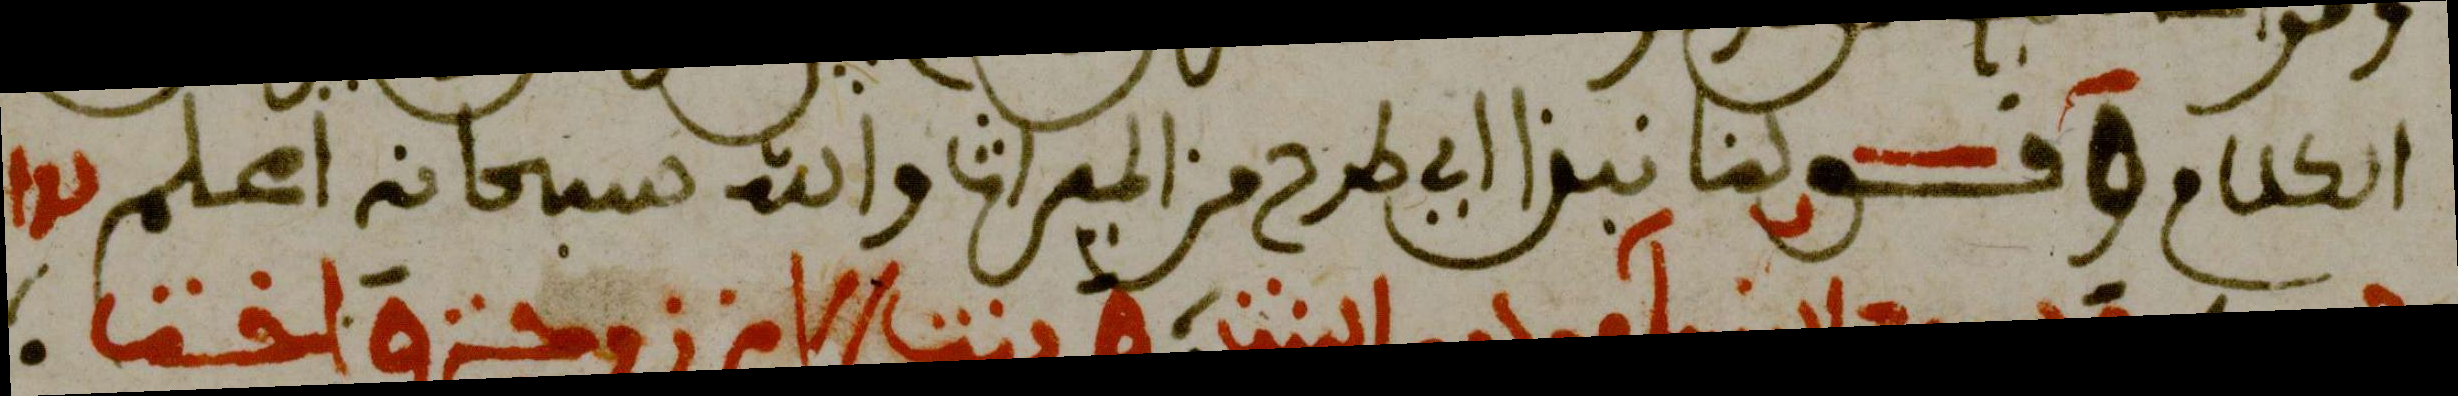الكلام وَقَولنا نبذا اي طرح من الميراث والله سبحانه اعلم
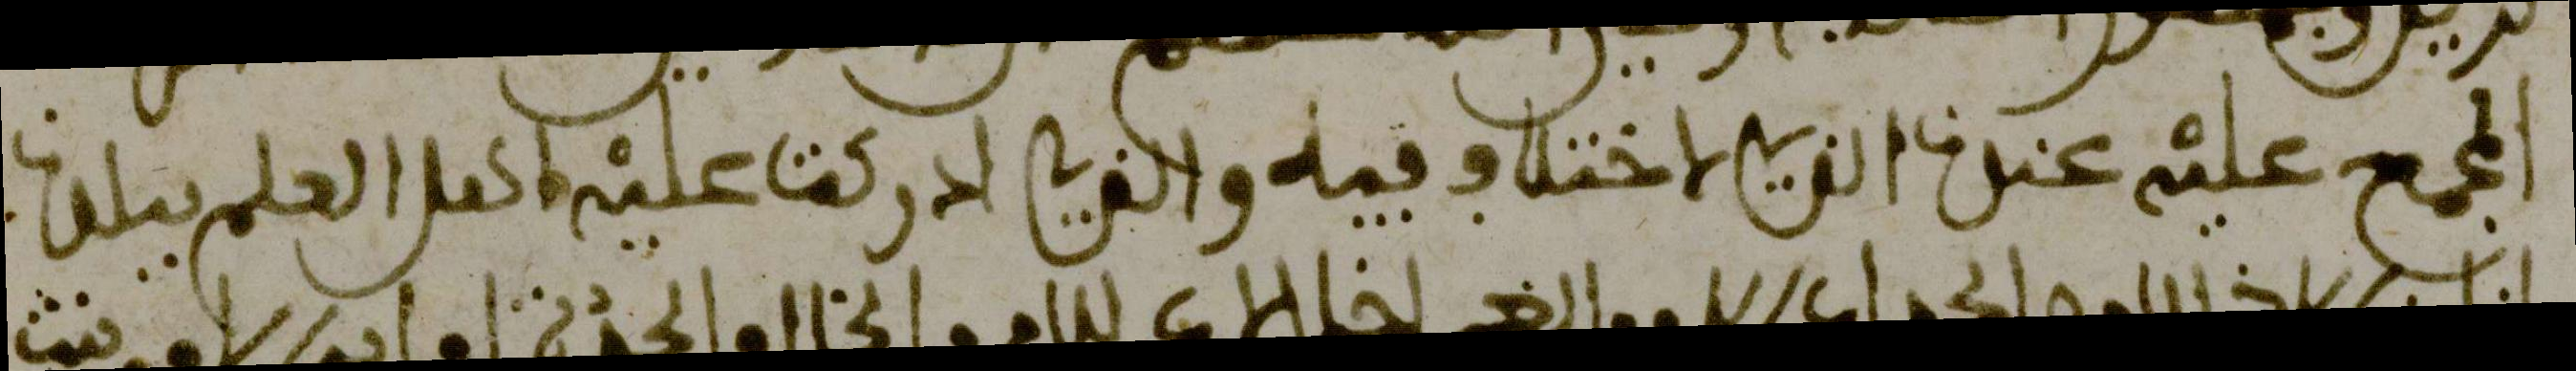المجمع عليْه عندنا الذي لاختلاف فيه والذي ادركت عليْه اهل العلم ببلدنا
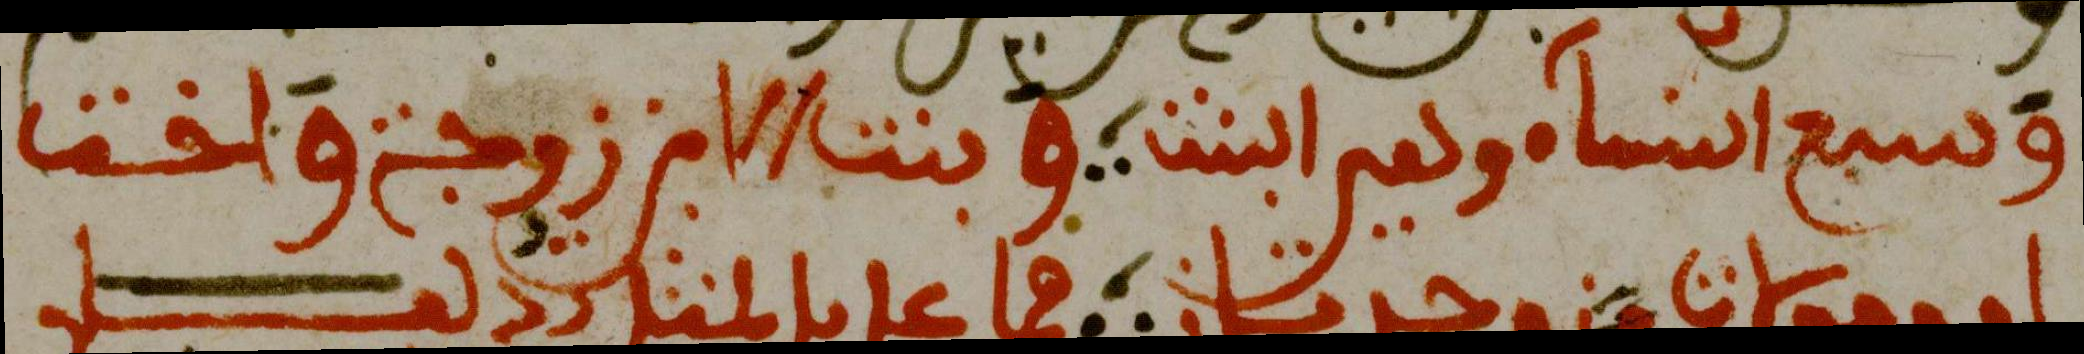وَسبع النساء وهي البنت وبنت الابن زوجة وَاخت
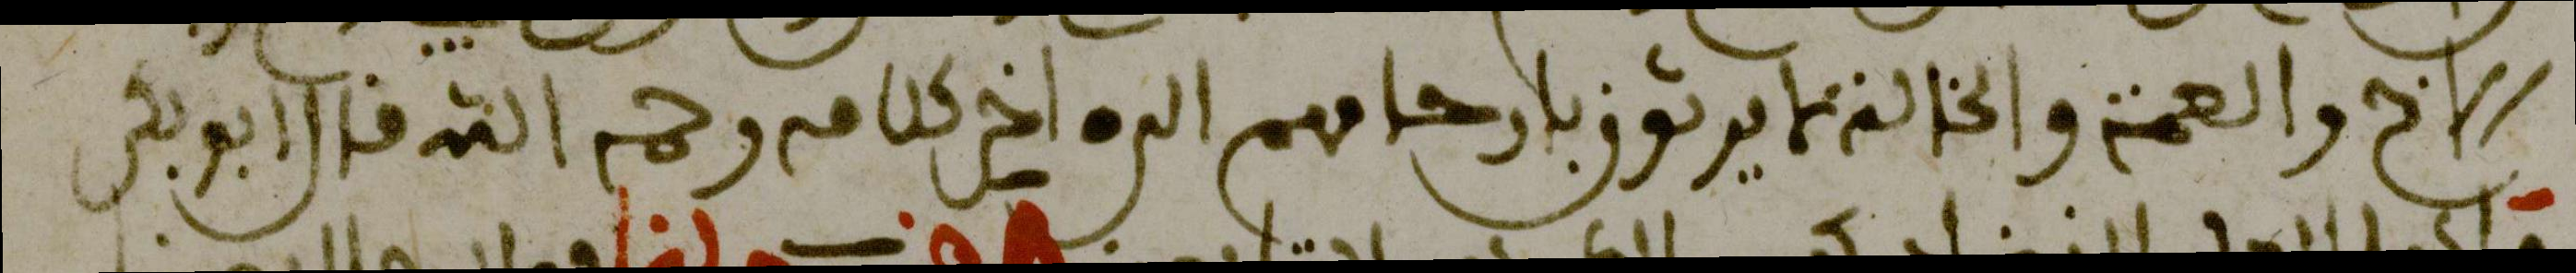الاخ والعمة والخالة لا يرثون بارحامهم الى ءاخر كلامه رحمه الله قال ابو بكر
